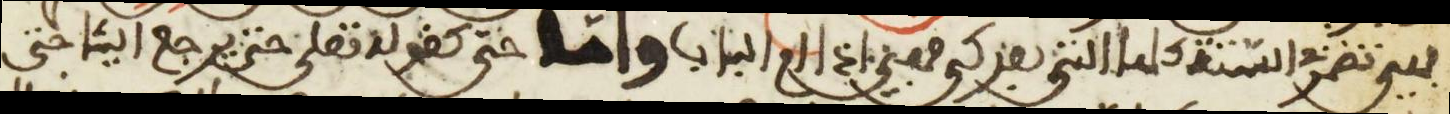بين تضمر في الستة كلها التي بعد كي فهي اذ لم الباب و اما حتى كقوله تعلى حتى يرجع اليا حتى
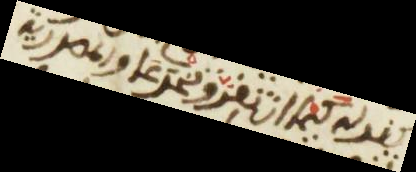كقوله كيفا ان تقرو# و المصدرية
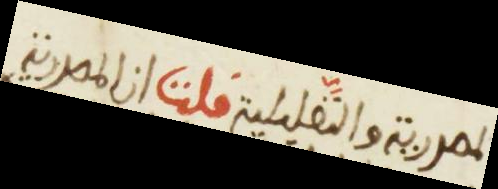المصدرية و التعليلية قلت ان المصدرية
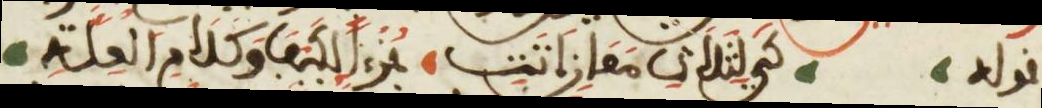قوله كي لثلاث معان اتت جزءا لكيفا وكلام العلة
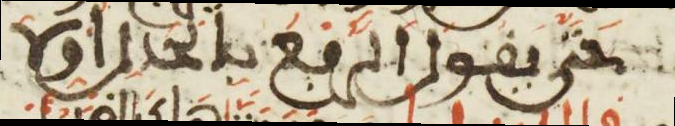حتى يقول الرفع بالجدل اولا
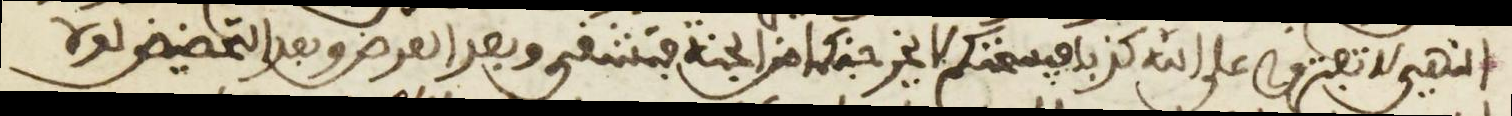النهي لا تفتروا على الله كذبا فيسحقكم لا يخرجنكما من الجنة فشقى و بعد العرض و بعد التحضيض لولا
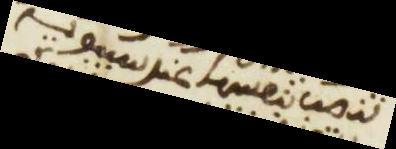تنص بنفسها عند سيبويه
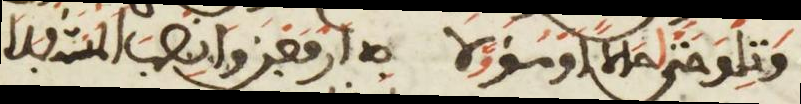و تلو حتى حالا او مؤولا به ارفعن و انصب المستقبلا
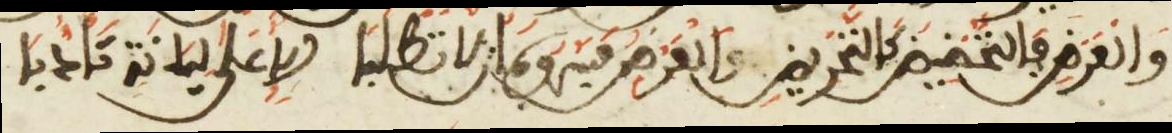و العرض فالتحضيض كالتحريض و العرض فسروه ان لا تطلبا الا على ليانة تأدبا
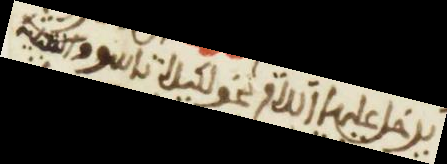يدخل عليها اللام نحو لكيلا : #
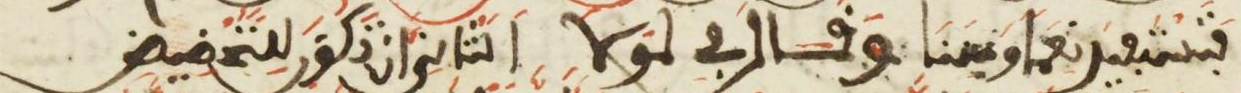فتستبحين نعما و سننا و قال فى لولا الثاني ان تكون للتحضيض
